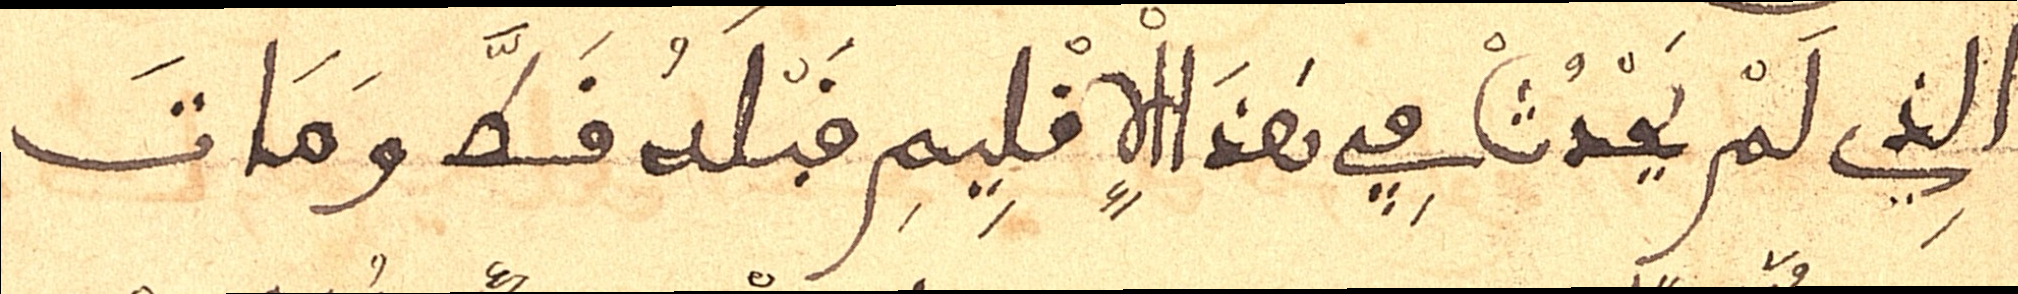الذي لم يحدث في هذا الاقليم فبله قط ومات
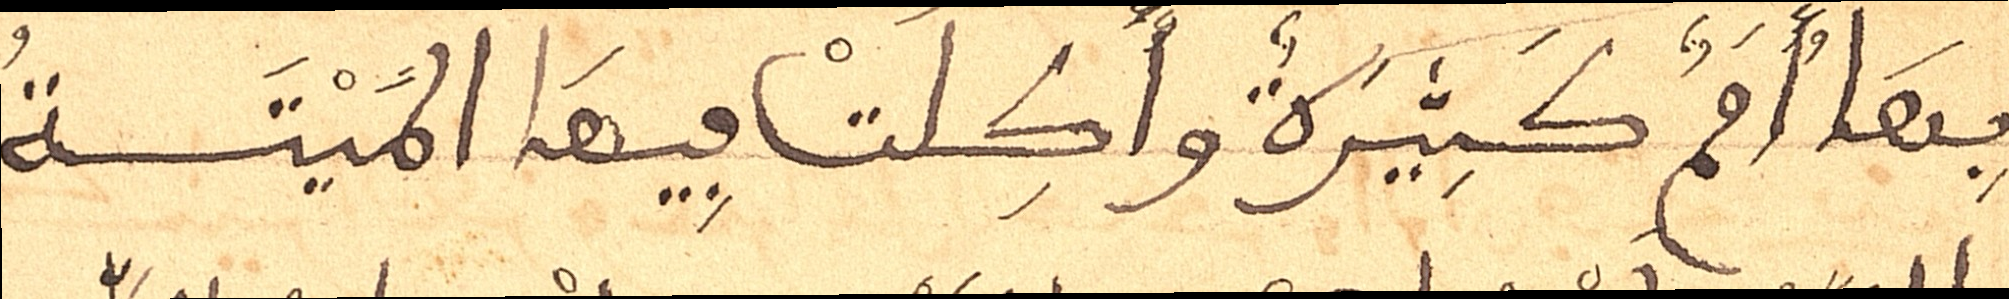بها امم كثيرة واكلت قيها الميتة
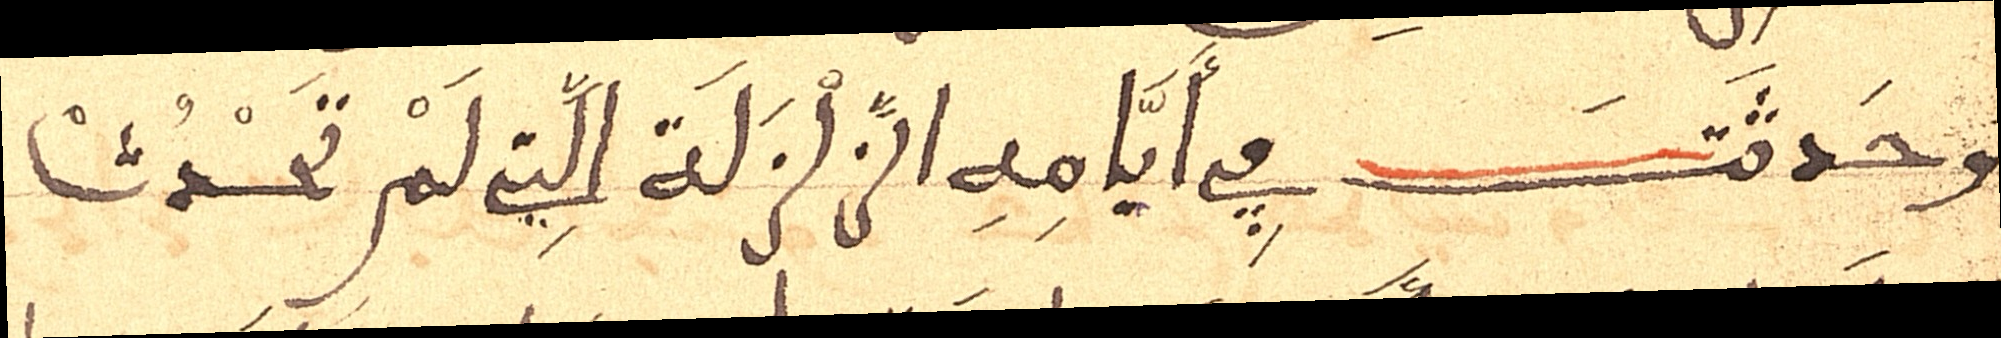وحدثت في ايامه الزلزلة التي لم تحدث
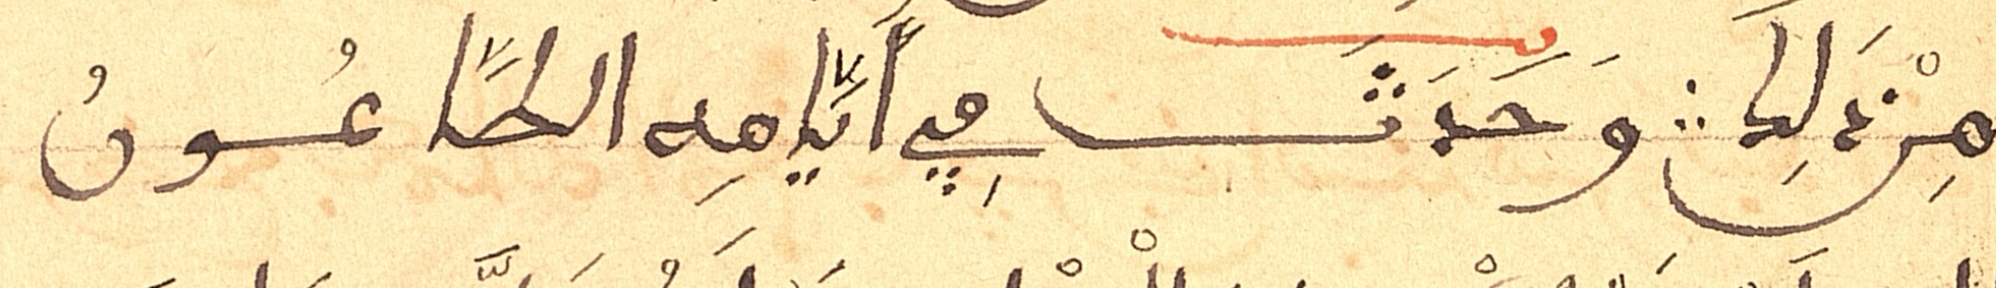من ذلك وحدث في ايامه الطاعون
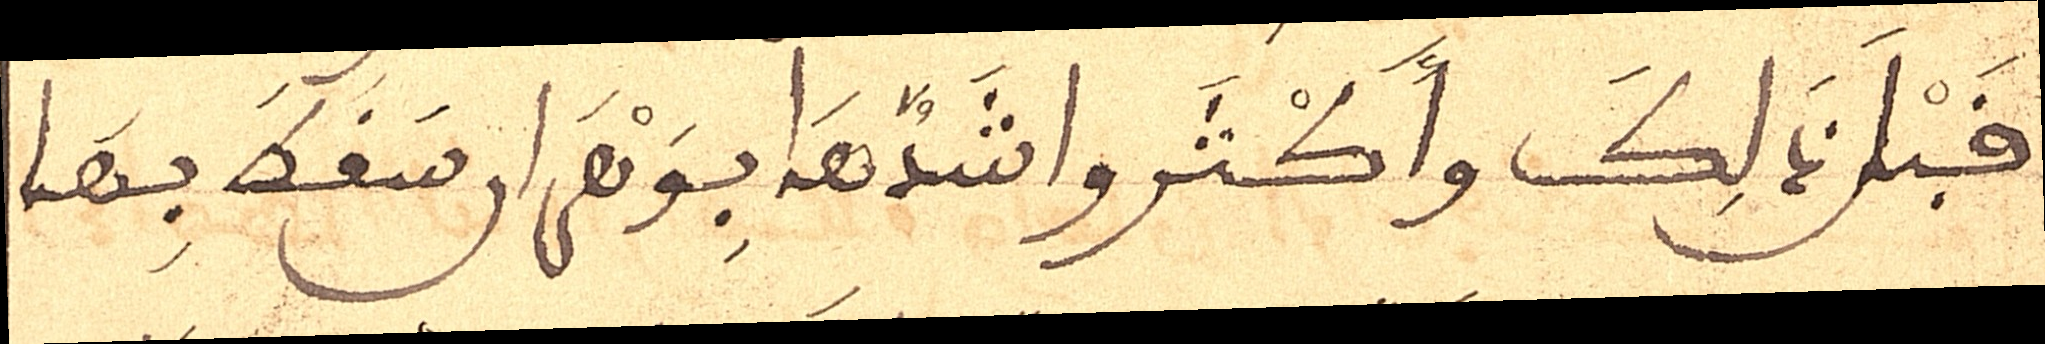قبل ذلك واكثر واشدها بوهران سقط بها
